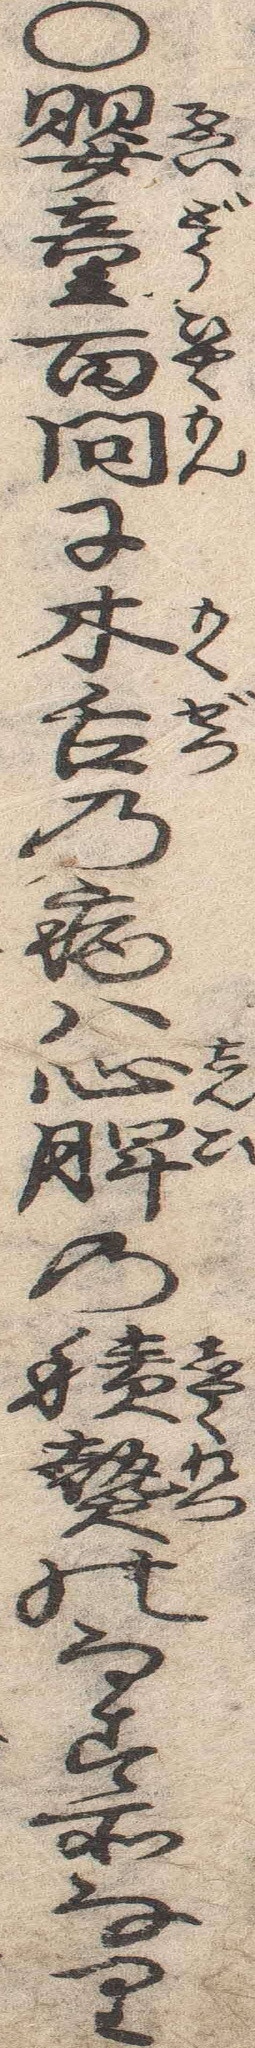○嬰童百問に木舌の病は心脾の積熱のなす所なり
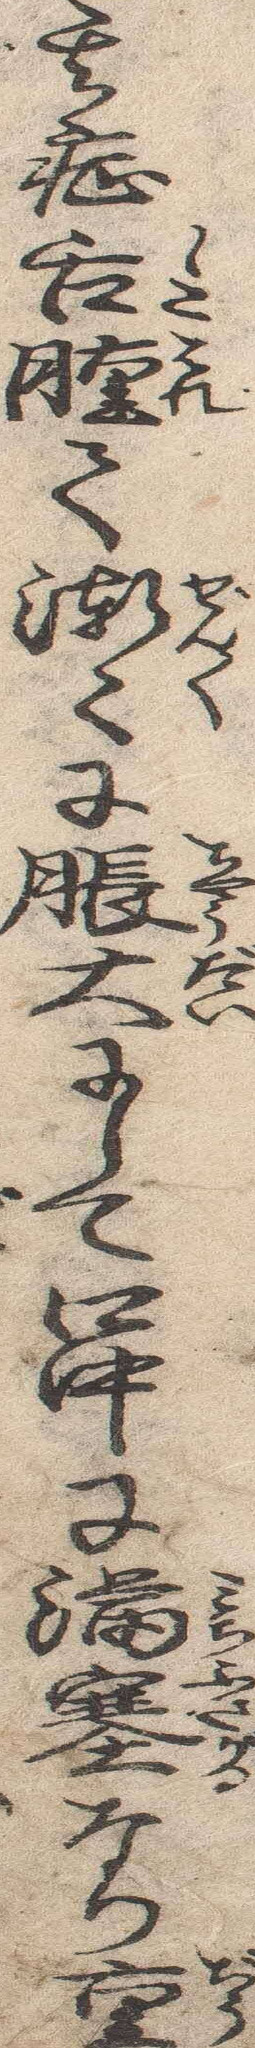其症舌腫て漸々に脹大にして口中に満塞なり重
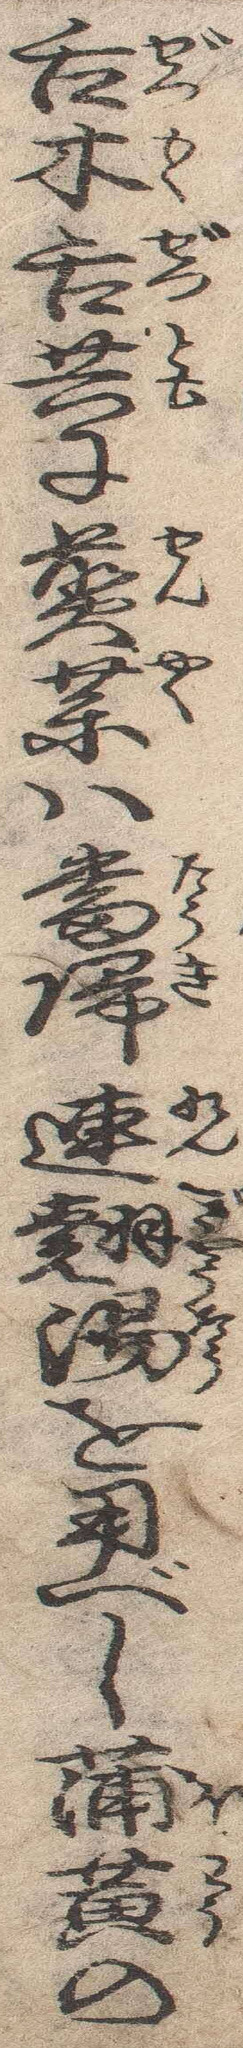舌木舌共に煎薬は当帰連翹湯を用べし蒲黄の

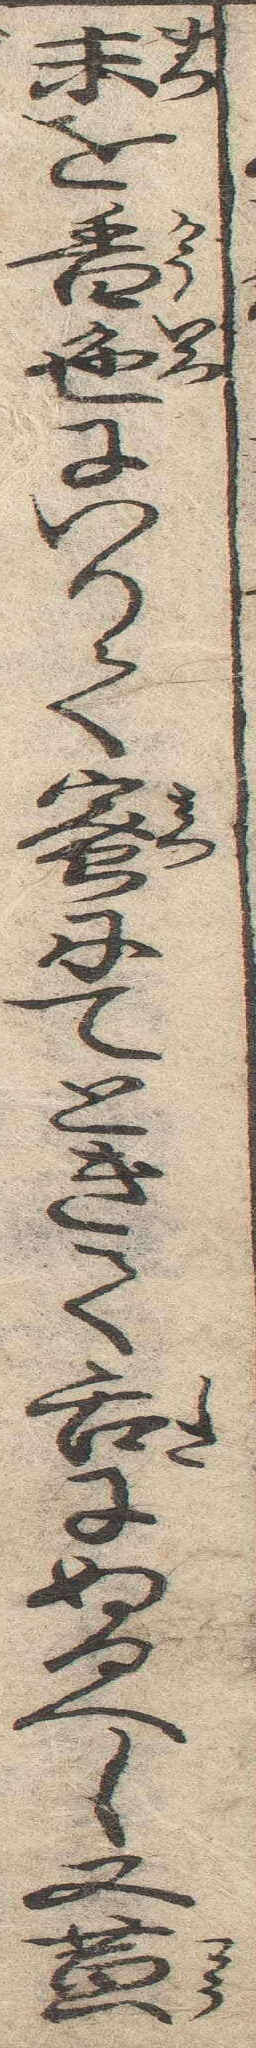末を香色にいりて蜜にてときて舌にぬるへし又黄
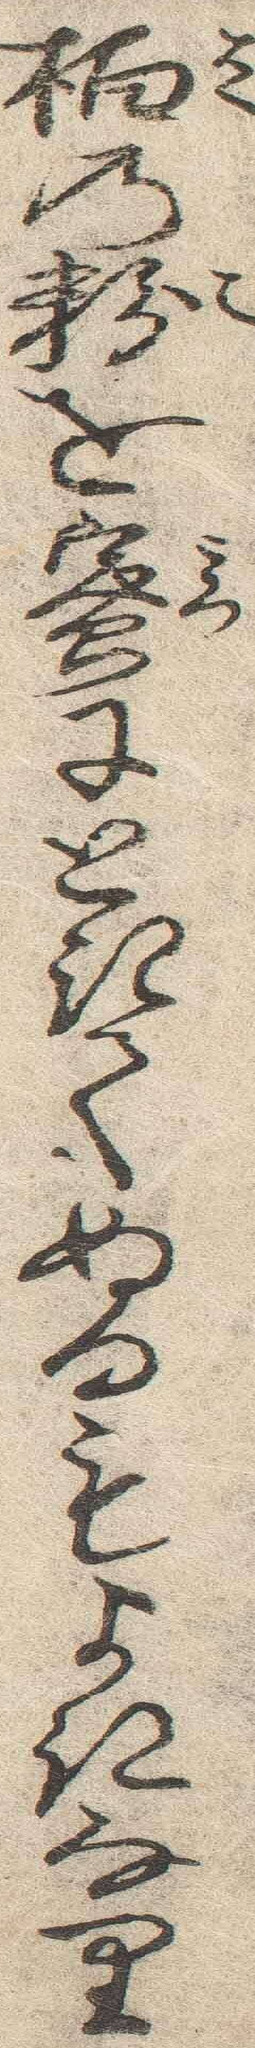栢の粉を蜜にときてぬるもよきなり
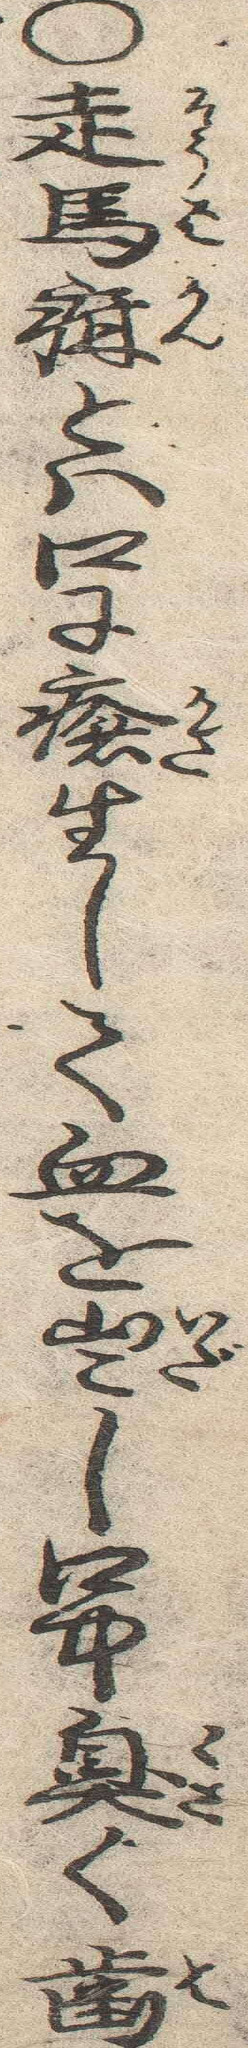○走馬疳とは口に瘡生して血を出し口中臭く歯
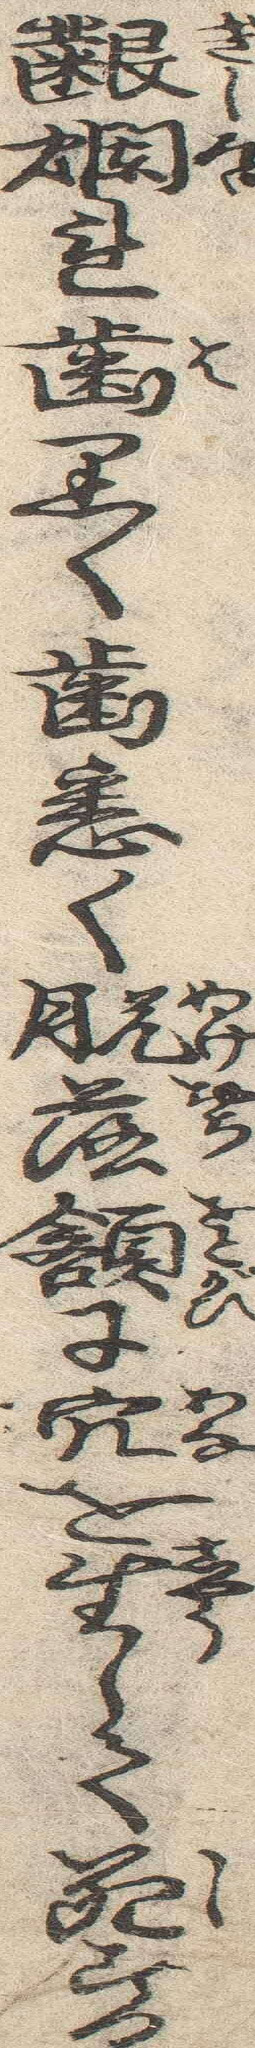齦爛れ歯黒く歯悉く脱落頷に穴を生して死する
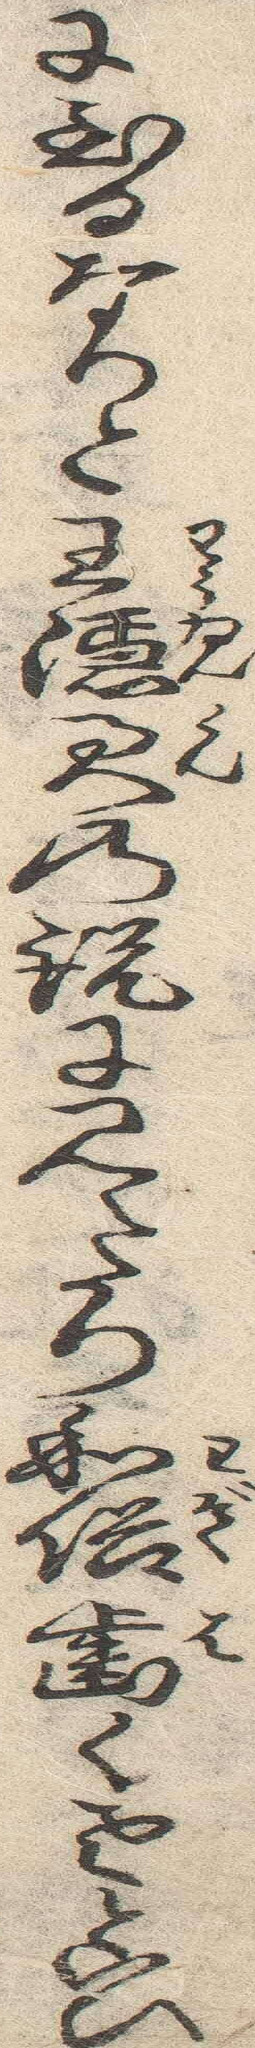に至るなりと王隠君の説に見えたり和俗歯くせといひ
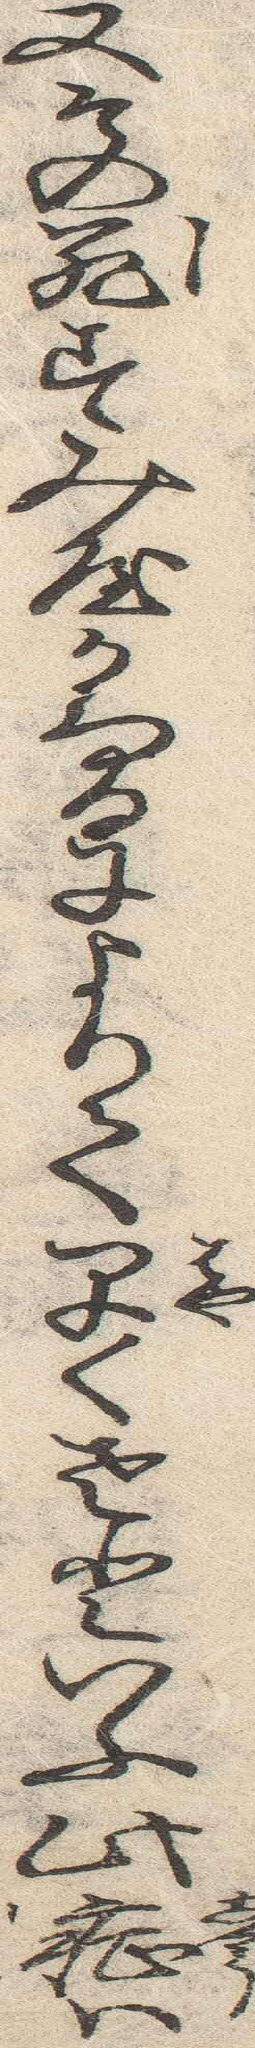又その死すみやかなるによりて早くせといふ此症は
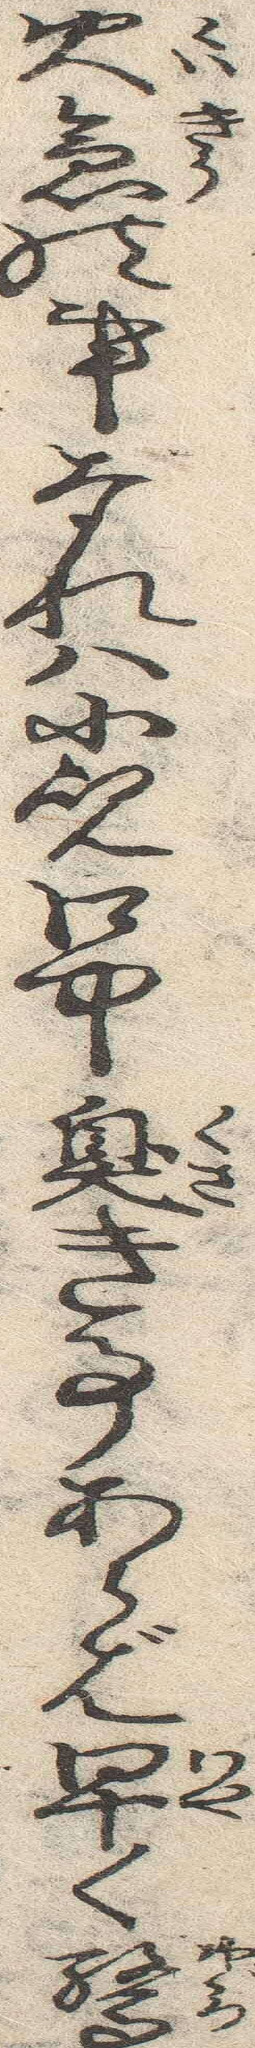火急の事なれは小児口中臭き事あらば早く驚
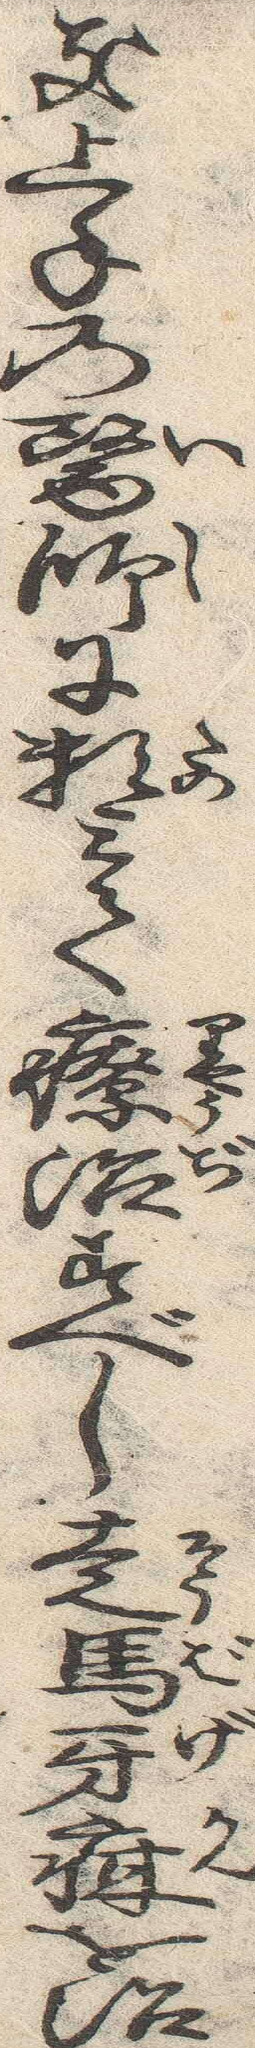き上手の医師に頼みて療治すべし走馬牙疳を治
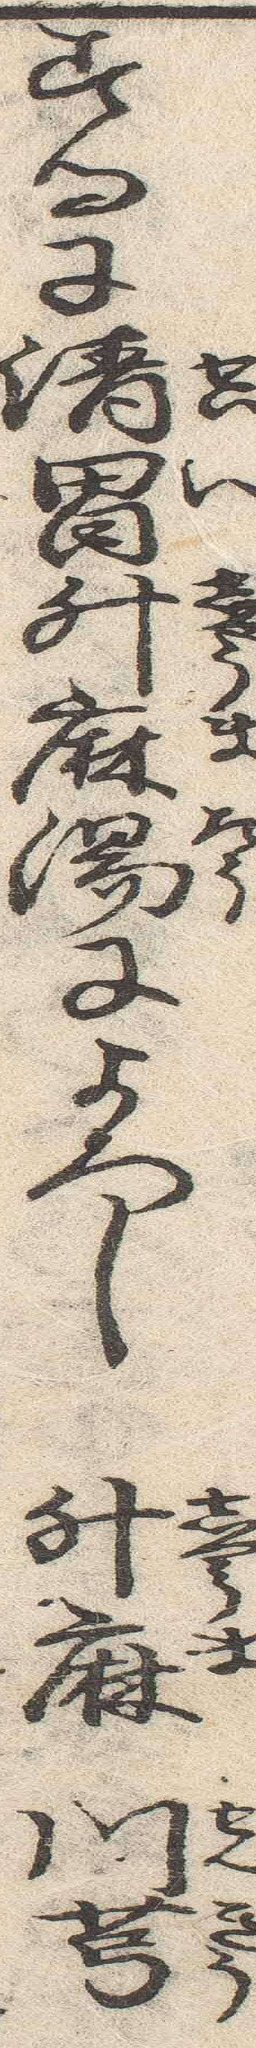するに清胃升麻湯によろし升麻川芎
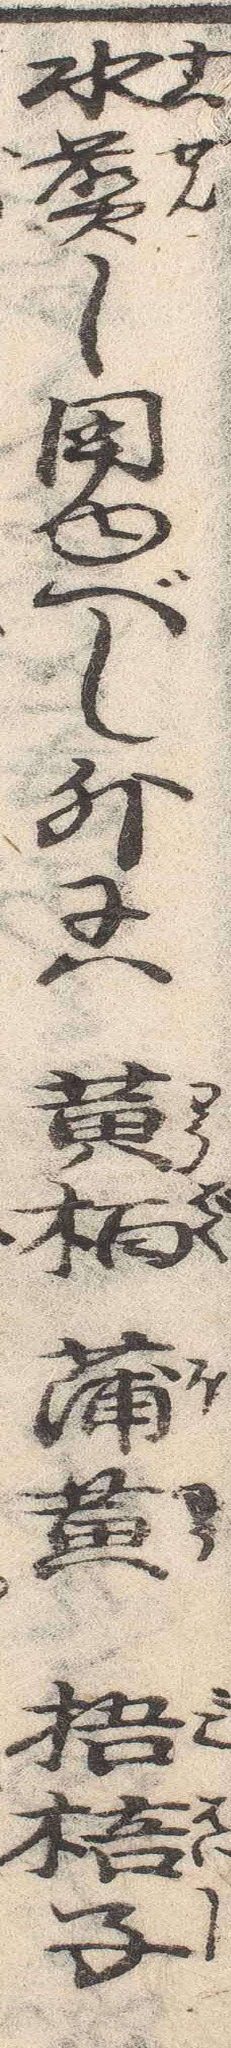水煎し用ゆべし外には黄栢蒲黄捂棓子
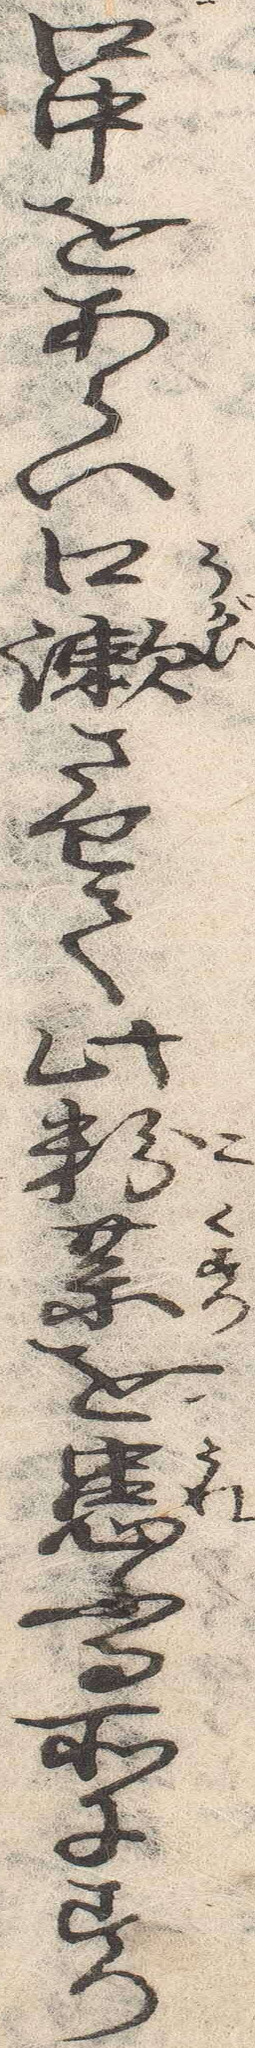口中をあらい口漱させて此粉薬を患ふる所にすり
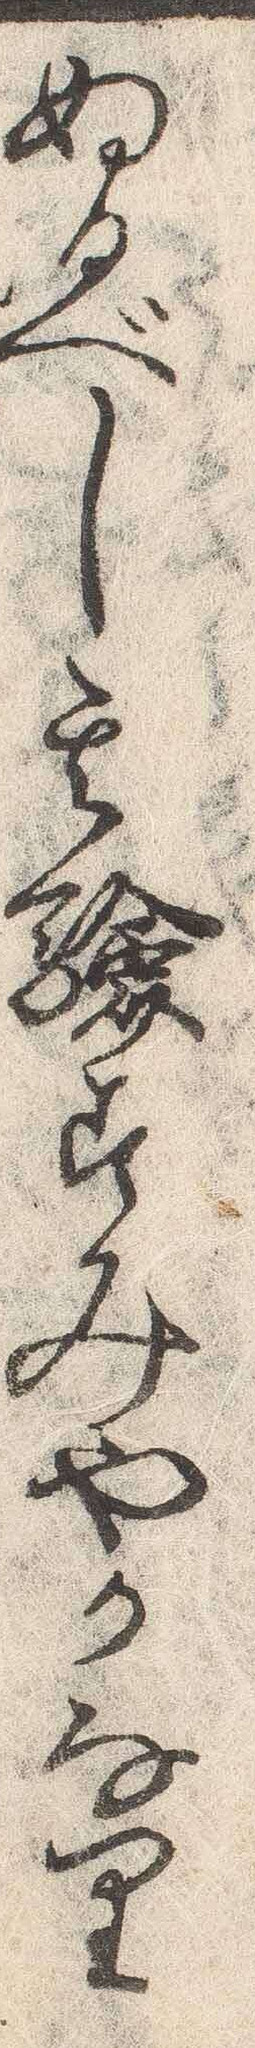ぬるべし其験すみやかなり
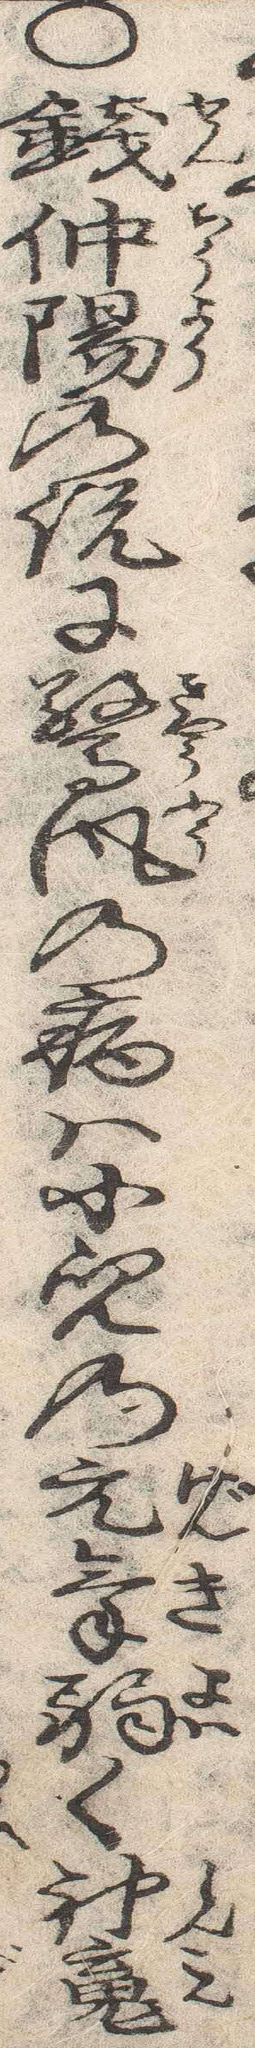○銭仲陽の説に驚風の病は小児の元気弱く神魂
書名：小児必用養育草
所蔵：東京学芸大学附属図書館 国文学研究資料館
